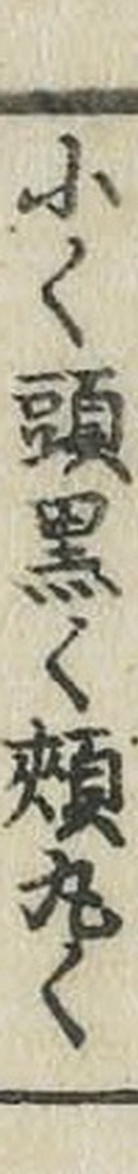小く頭黒く頬丸く
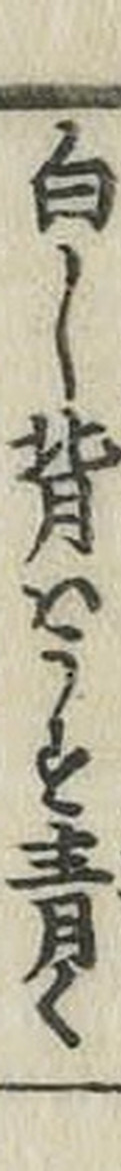白し背はうす青く
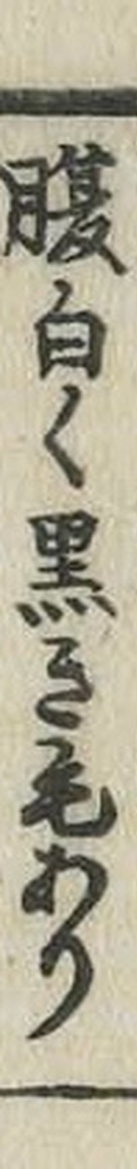腹白く黒き毛あり
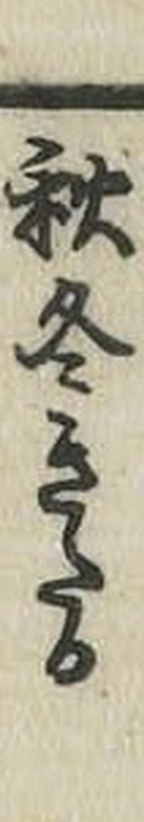秋冬きたる

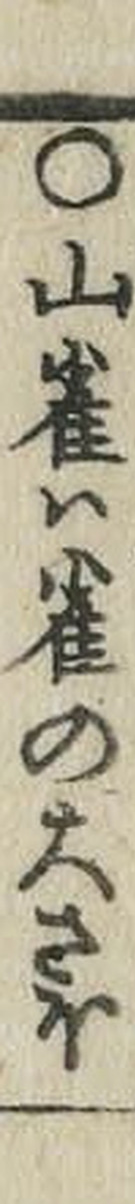○山雀は雀の大さほ
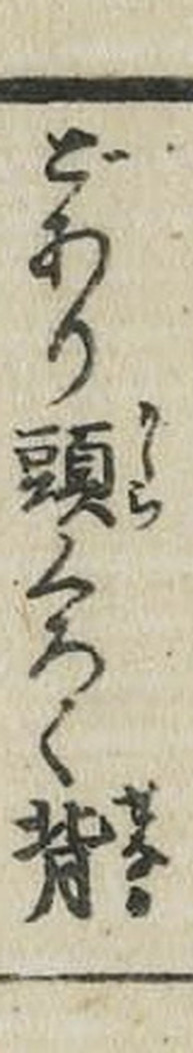どあり頭くろく背
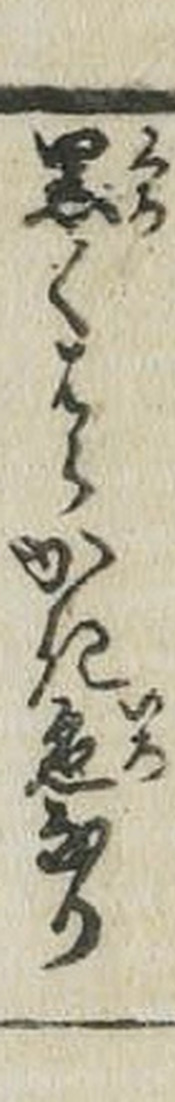黒くはらかき色なり
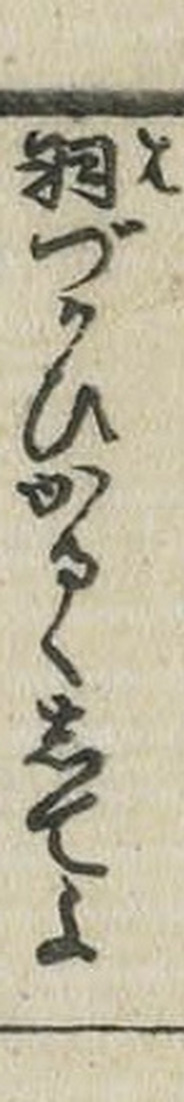羽づかひかるくしてよ
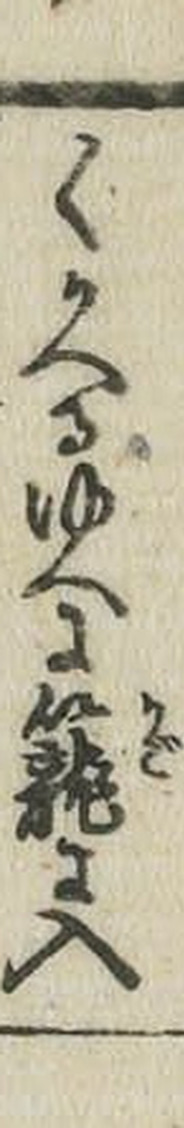くかへるゆへに籠に入
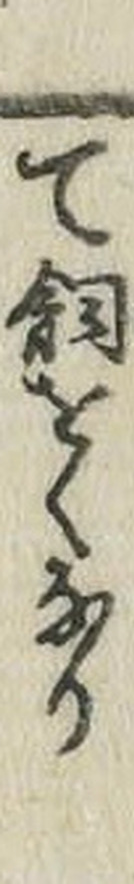て飼をくなり
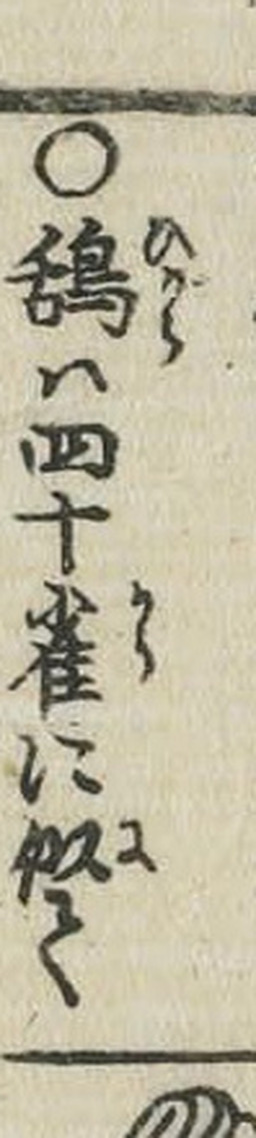○鴰は四十雀に似て
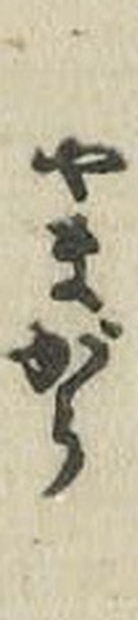やまがら
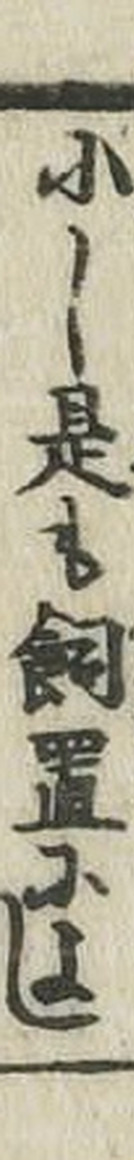小し是も飼置によし
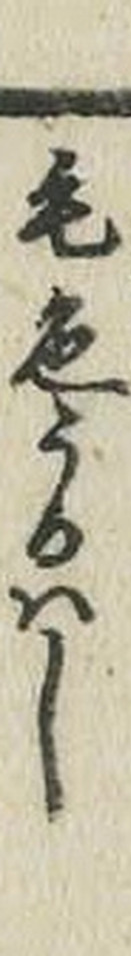毛色うるはし
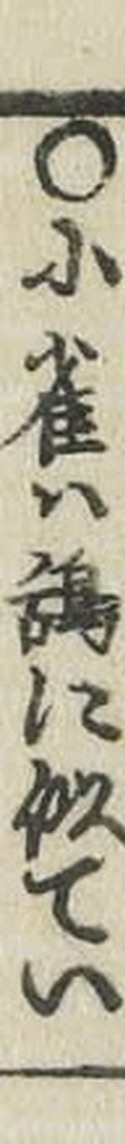○小雀は鴰に似てい
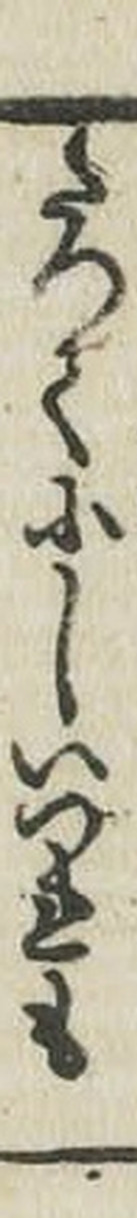たつて小しいづれも
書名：増補頭書訓蒙図彙大成 10巻 6:巻之12-13
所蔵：東京学芸大学教育コンテンツアーカイブ
